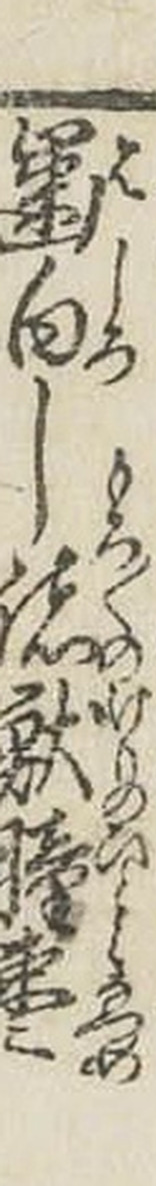歯白し諸獣瞳棗
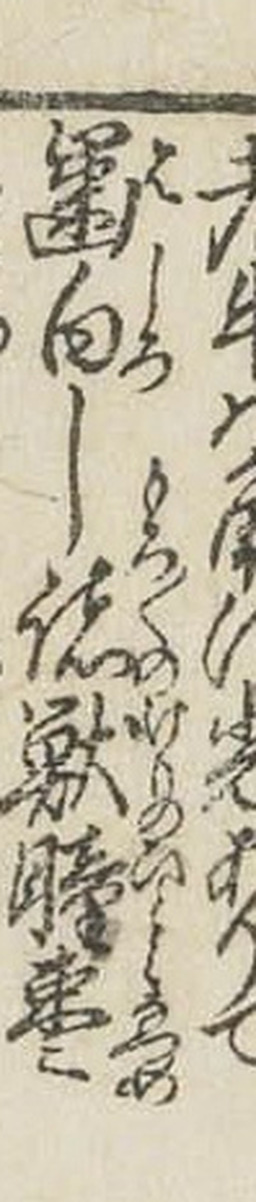歯白し諸獣瞳棗
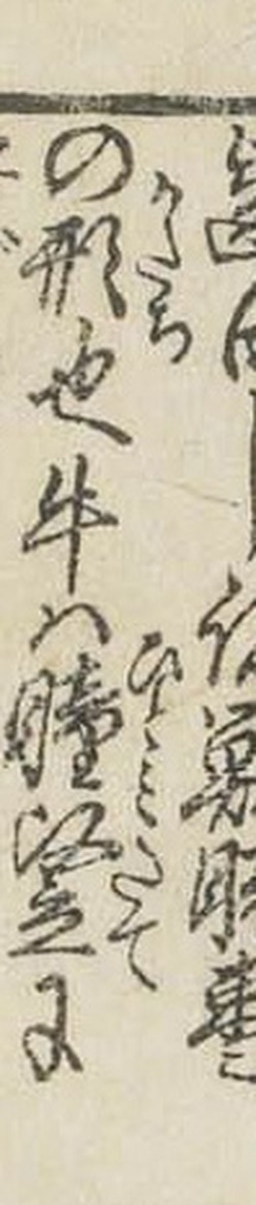の形也牛は瞳竪に
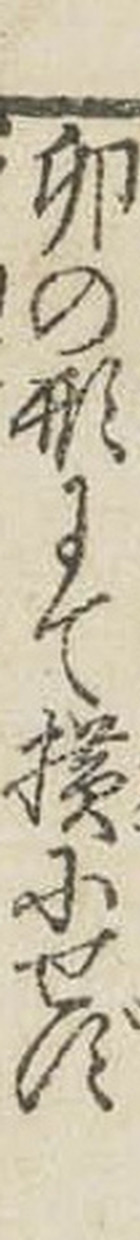卵の形にて横にせず
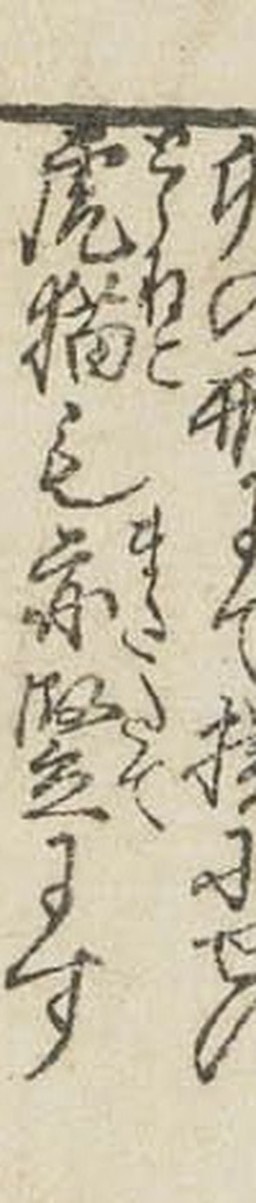虎猫も亦竪にす
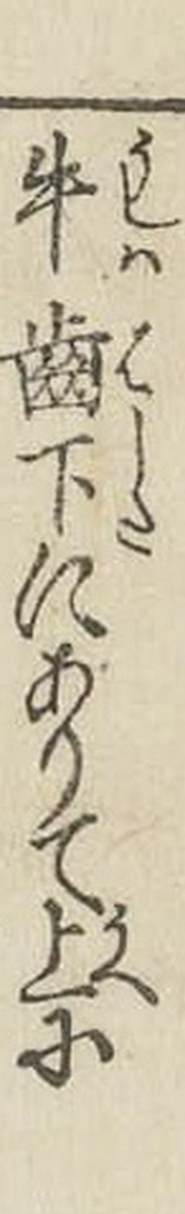牛は歯下にありて上に
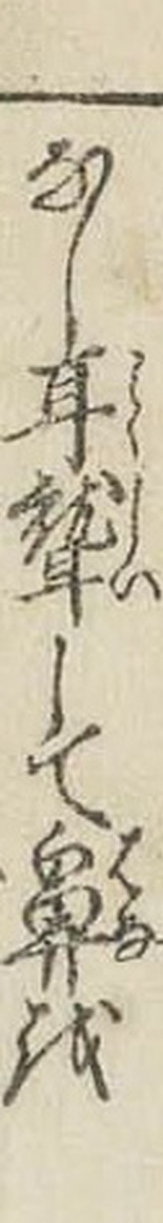なし耳聾して鼻を
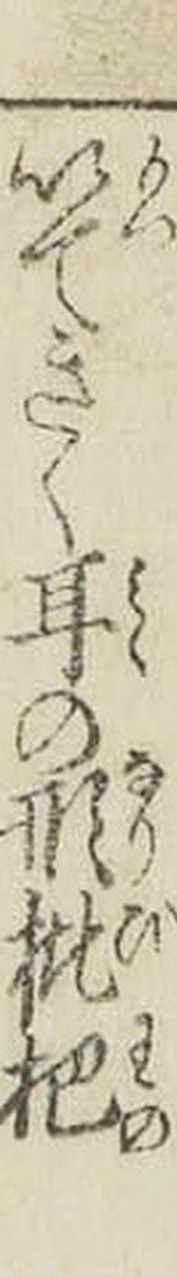以てきく耳の形枇杷
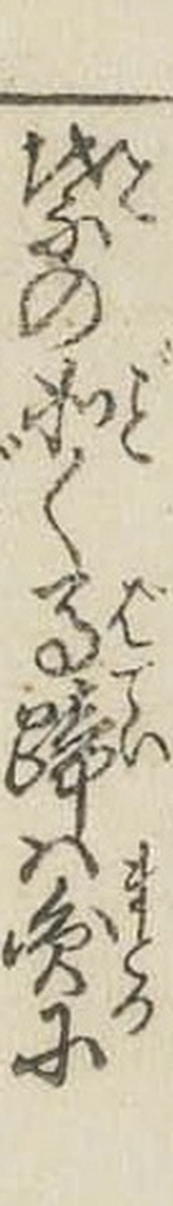葉の如く馬蹄は円に
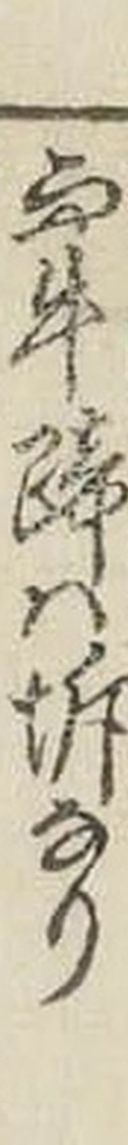而牛蹄は坼なり
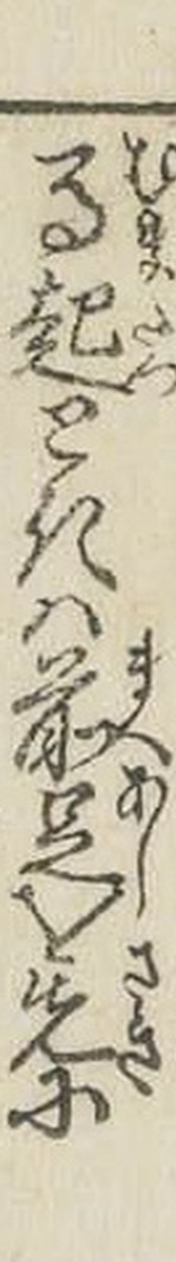馬起ときは前足を先に
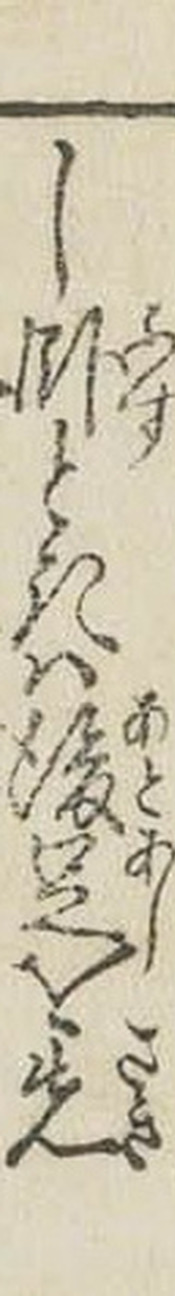し臥ときは後足を先
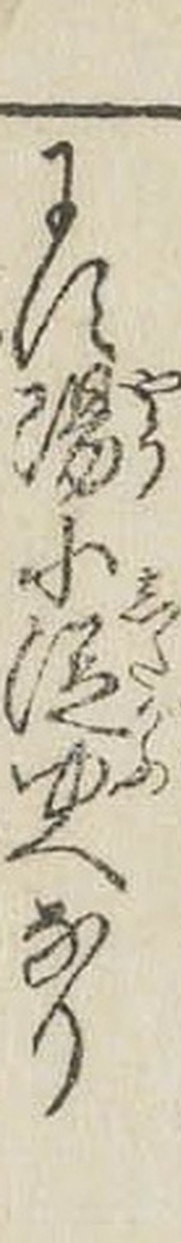にす陽に従ゆへなり
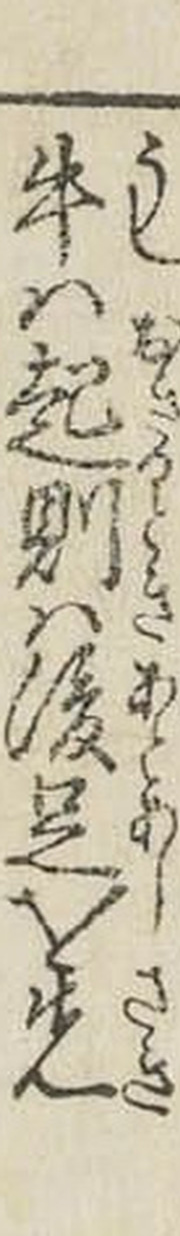牛は起則は後足を先
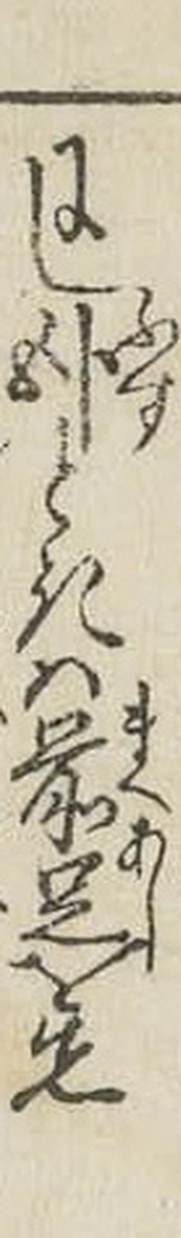にし臥ときは前足を先
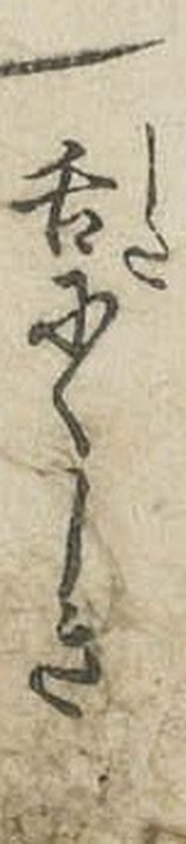舌にくしき
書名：絵本写宝袋 9巻 9之巻下
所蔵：東京学芸大学教育コンテンツアーカイブ
